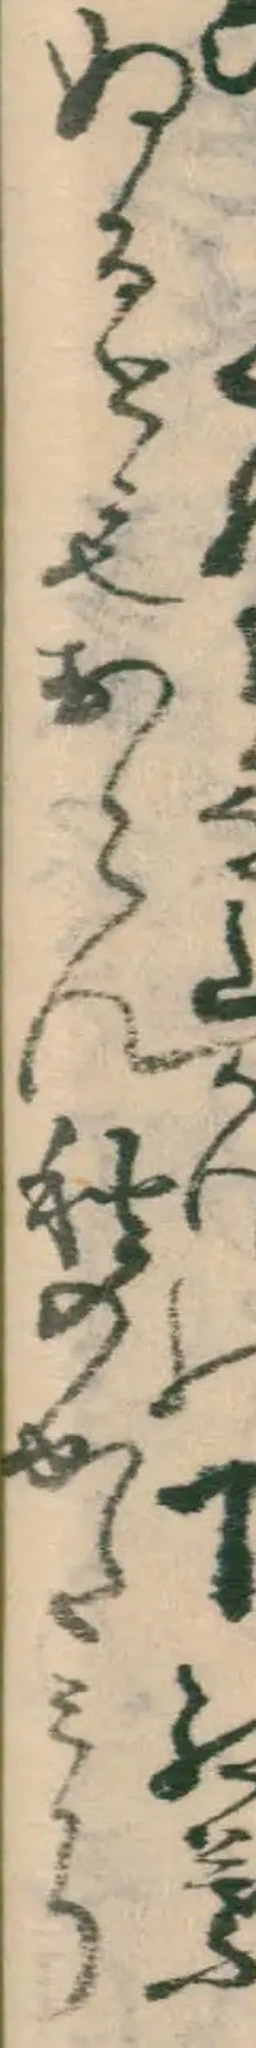ぬるともおらん秋のかたみに
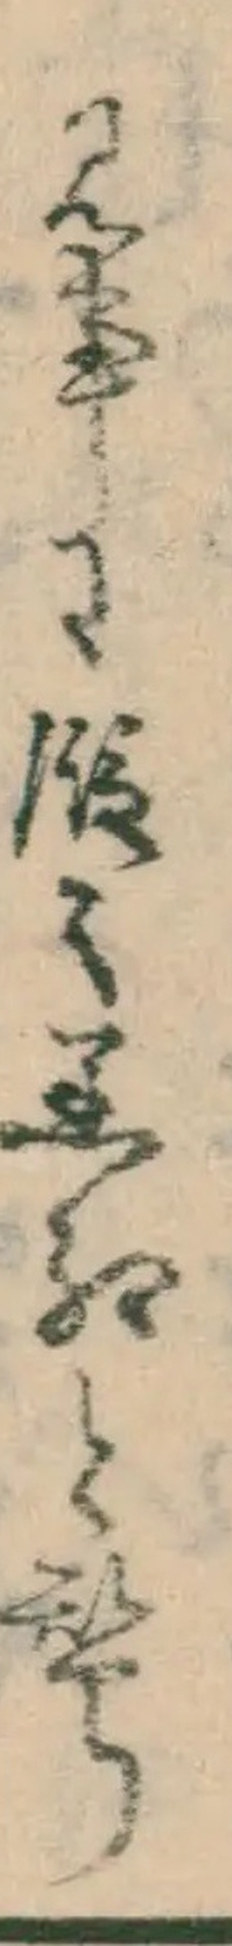見事に段々黒紅と替り
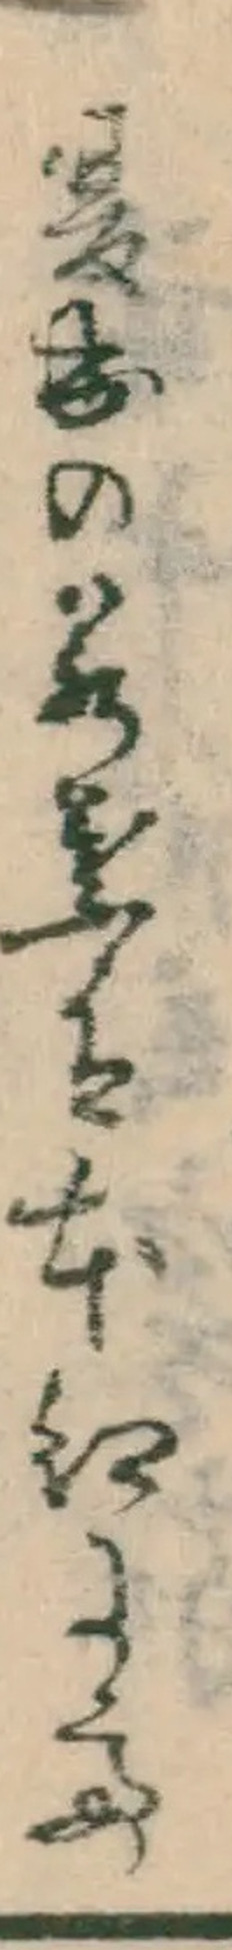夏出の若葉は本紅にて
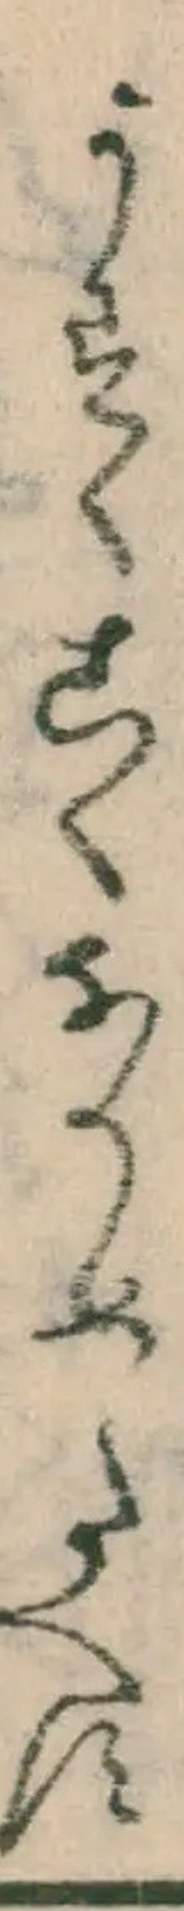うすくこくなかめたへす
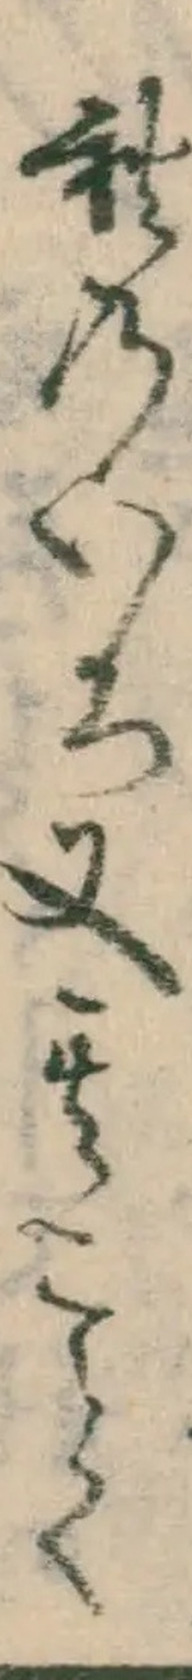秋のいろ又其ことく
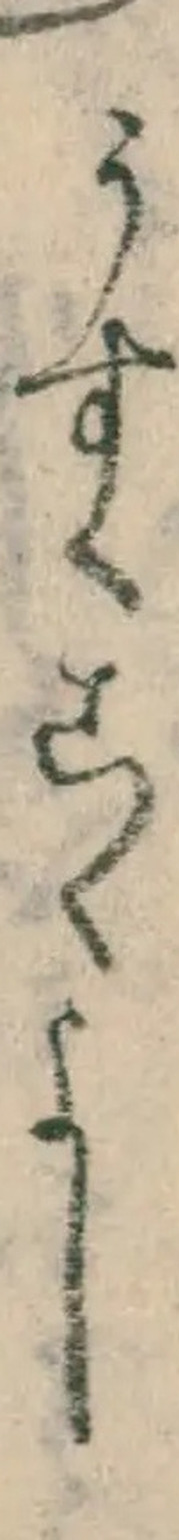うすくこくよし
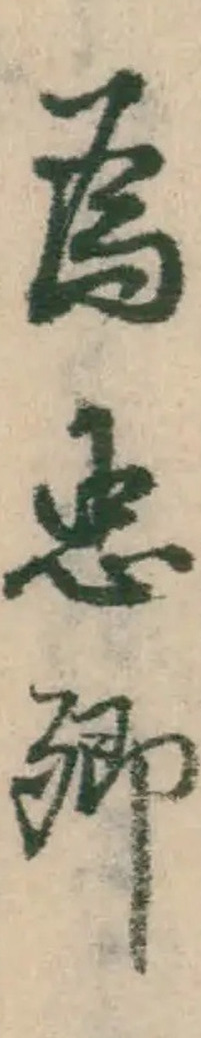為忠卿
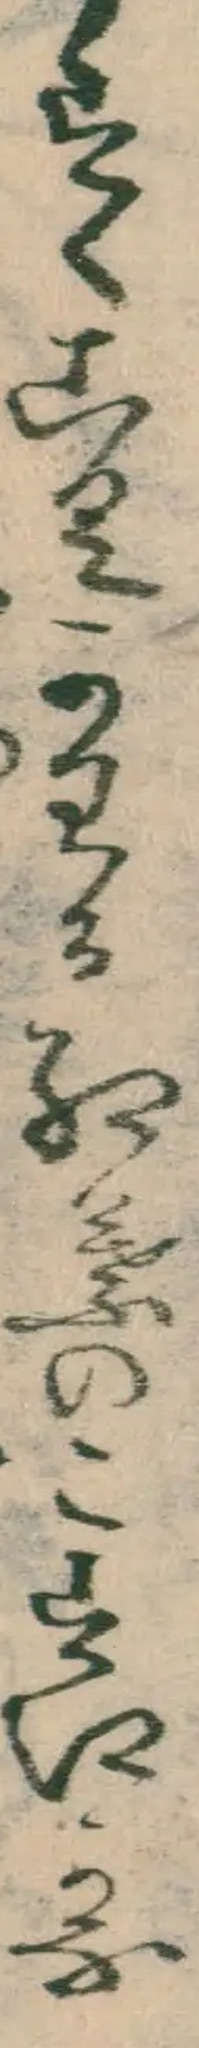うすくこくかわる紅葉のこすえかな
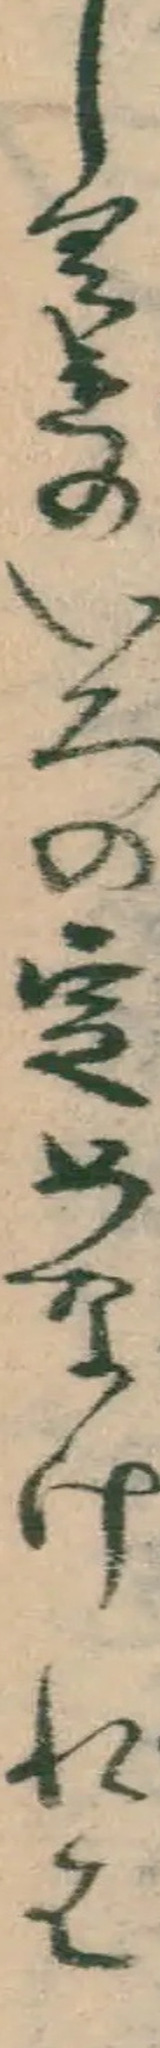しくれのいろの定めなけれは

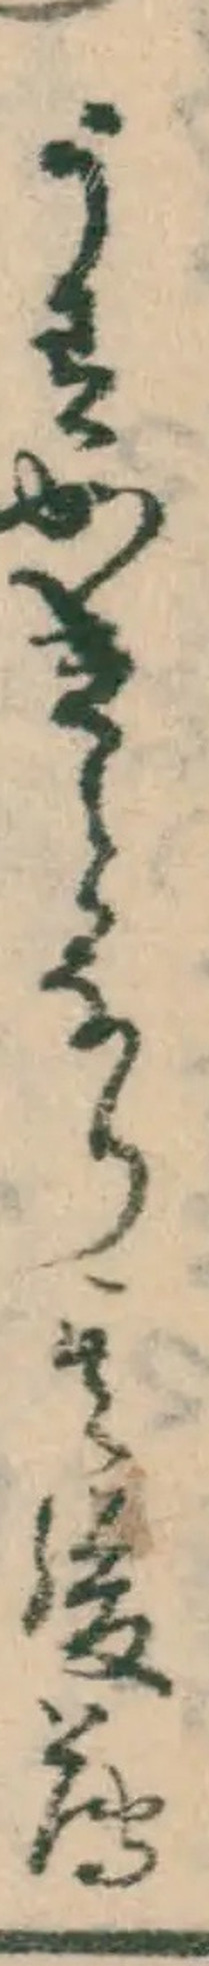うすかきとなり其後薄
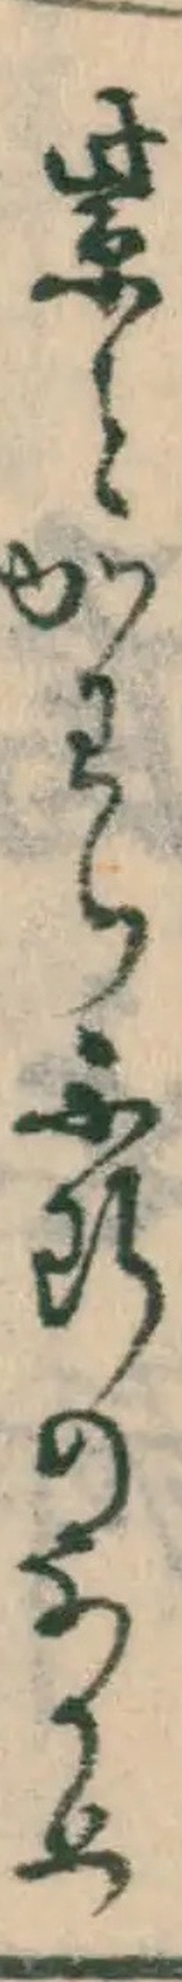紫とかわり不断のなかめ
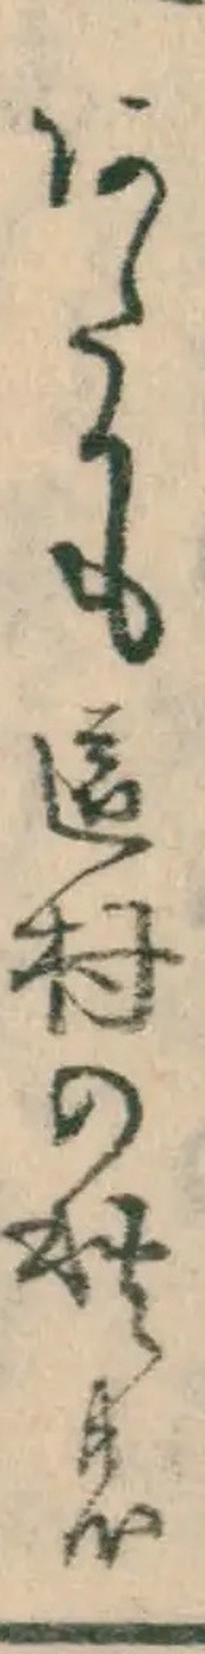あたかも遠村の秋の
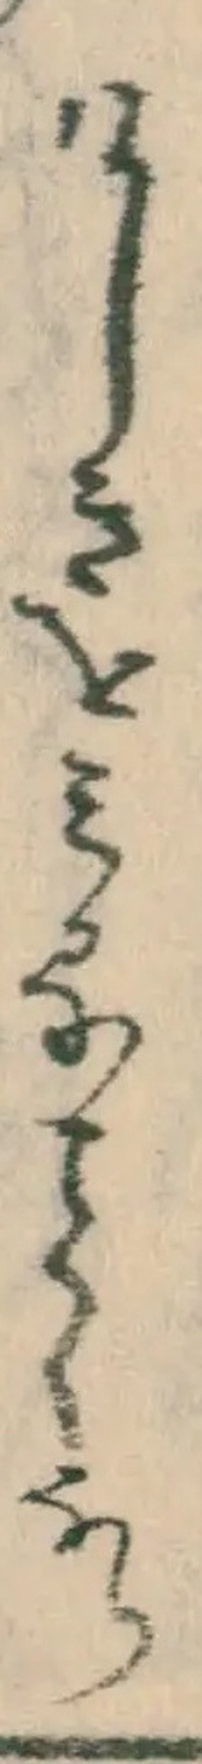けしきをみることくなり
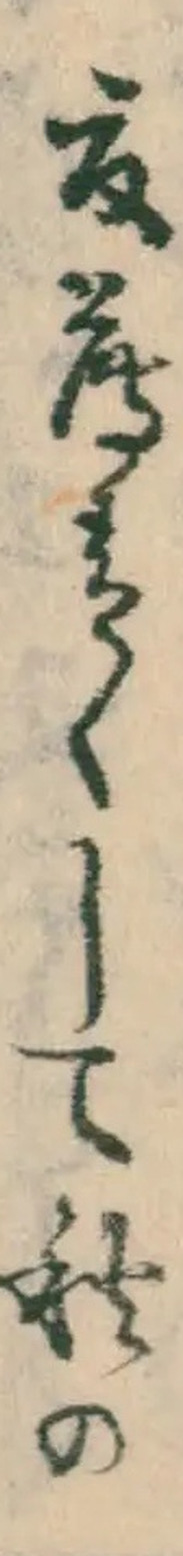夏薄青くして秋の
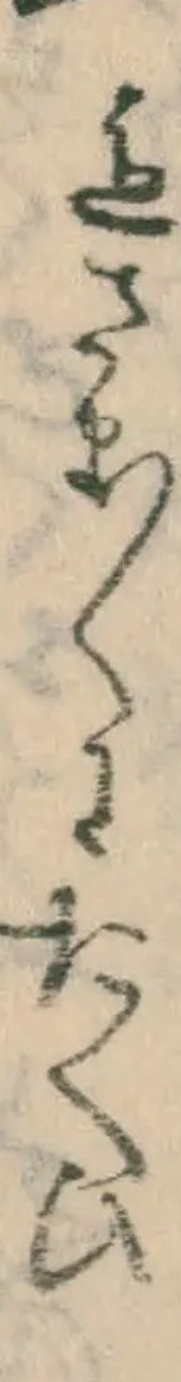色さま〳〵にたくひ
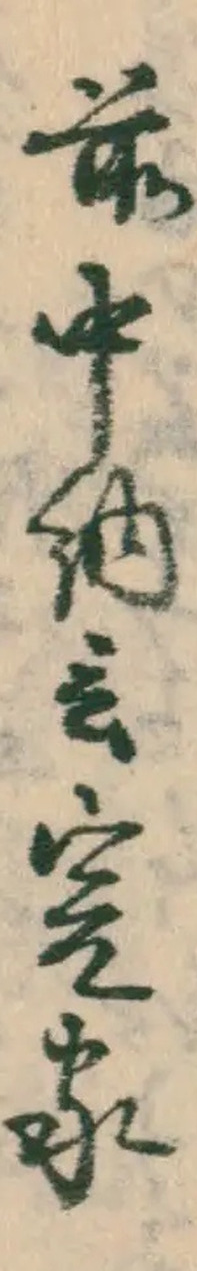前中納言定家
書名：紅葉集
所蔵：国立国会図書館 National Diet Library, JAPAN
